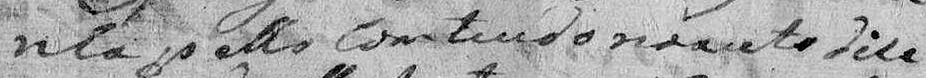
nha pello conteudo no auto dice
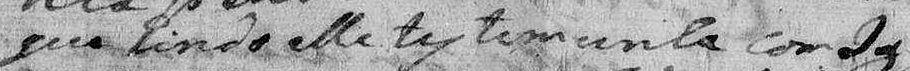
que hindo elle testemunha com Ig
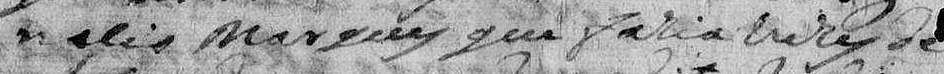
nacio Marques que fazia vezes de
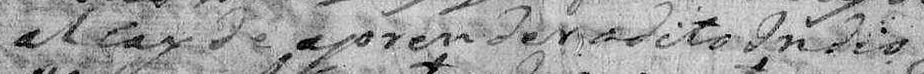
alcayde a prender o dito Indio
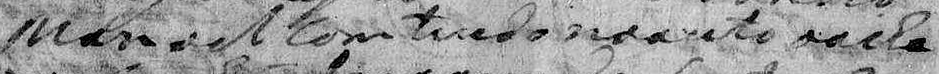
Manoel Comteudo no auto o acha
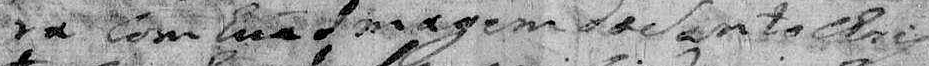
ra com huā Imagem do Santo chris
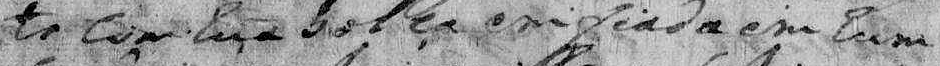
to com huā bolça emfiada em hum
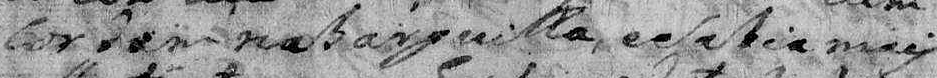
Cordam na barguilha, e sabia mais
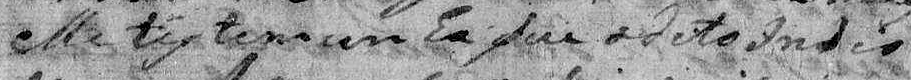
elle testemunha que o dito Indio
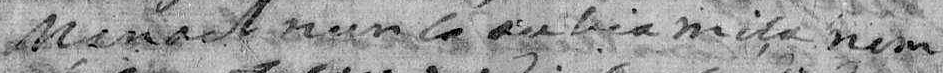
Manoel nunca ouvia miça nem
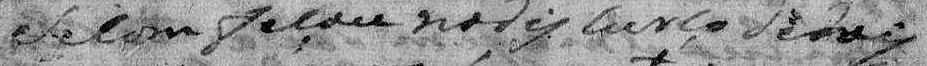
se comfeçou no disCurço de dois
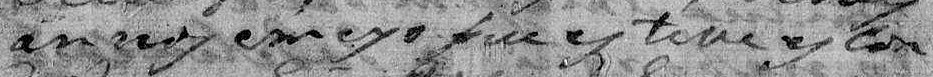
annos e meyo que esteue escon
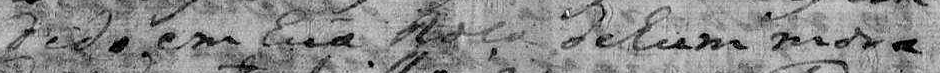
dido em huā Roça de hum mora
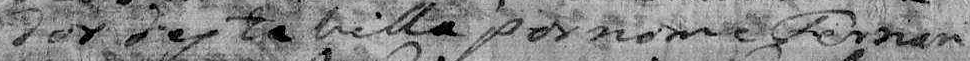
dor desta villa por nome Fernan
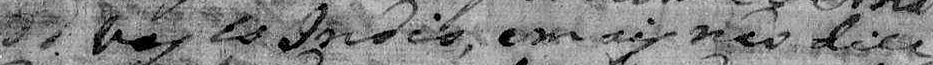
do vasco Indio, e mais naõ dice
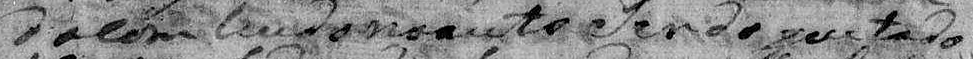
do comteudo no auto sendo que todo
